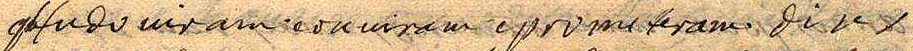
q̄ tudo uiram e ouuiram e prometeram dizer
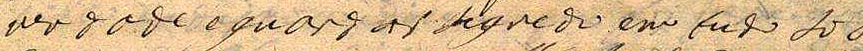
uerdade e guardar segredo em tudo sob
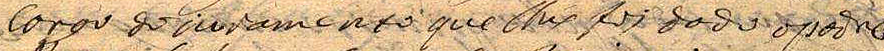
cargo do iuramento que lhes foi dado o padre
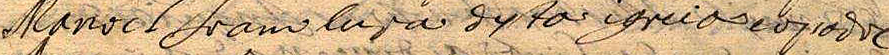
Manoel Joam cura desta igreia e o padre
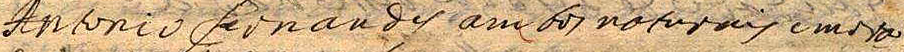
Antonio fernandes ambos naturais e mora
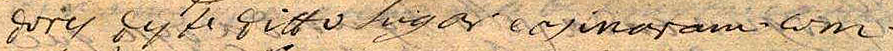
dores deste ditto lugar e asinaram com
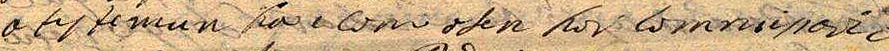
a testemunha e com o senhor commissario
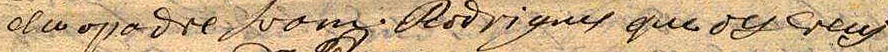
e eu o padre Ioam Rodrigues que o escreuj
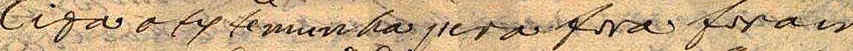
E ida a testemunha pera fora foram
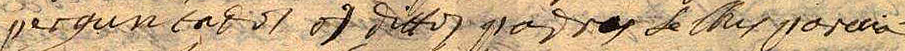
perguntados os dittos padres se lhes parecia
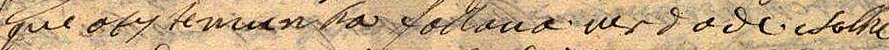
que a testemunha fallaua uerdade e se lhe
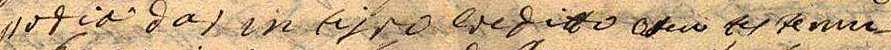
podia dar inteiro creditto a seu testemu
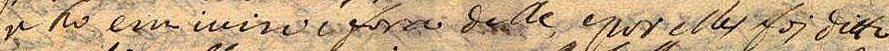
nho em iuizo e fora delle, e por elles foi ditto
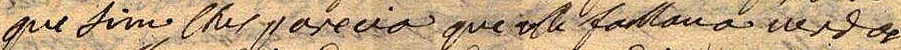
que sim lhes parecia que elle fallaua uerda
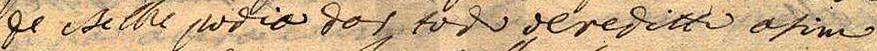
de e se lhe podia dar todo o creditto asim
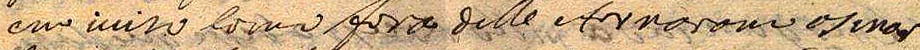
em iuizo como fora delle e tornaram asinar
